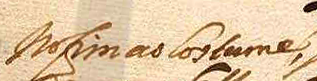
no fim ao Costume,
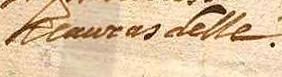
e couzas delle.
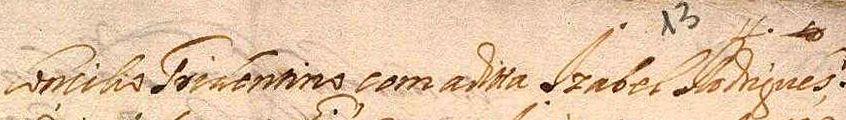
Concilio Tridentino com a ditta Izabel Rodrigues?
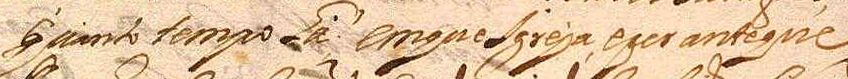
quanto tempo há; em que Igreja, e perante que
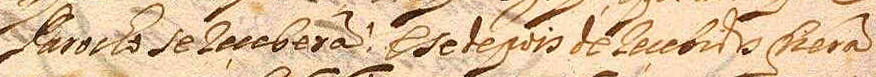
Parocho se Receberaõ? e se depois de Recebidos fizeraõ
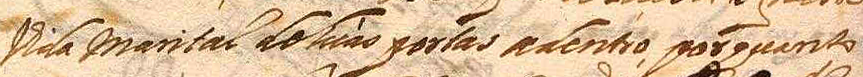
Vida marital de huās portas adentro, porquanto
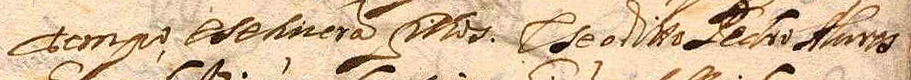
tempo, e se tiuerão filhos. E se o ditto Pedro Alures
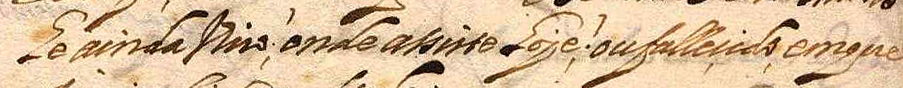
he ainda vivo, onde assiste hoje, ou fallecido, em que
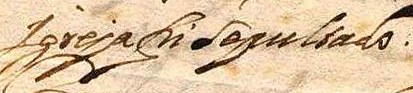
Igreja foi sepultado:
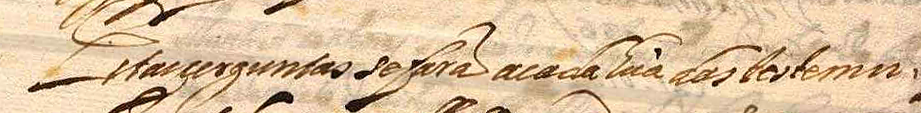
Estas perguntas se faraõ a cada huā das testemu
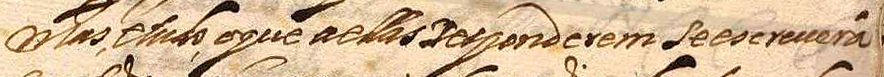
nhas, e tudo o que a ellas responderem se escreuerā
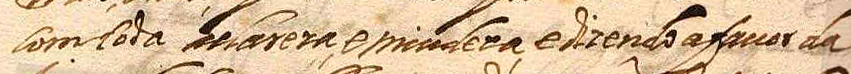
com toda a clareza, e miudeza, e dizendo a fauor da
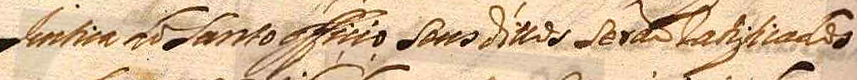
Justica ao santo officio seus dittos seraõ Ratificados
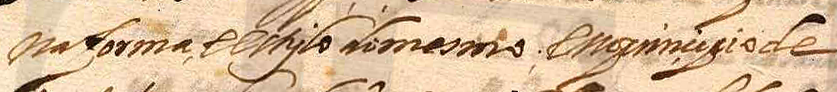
na forma e estylo do mesmo, e no principio de
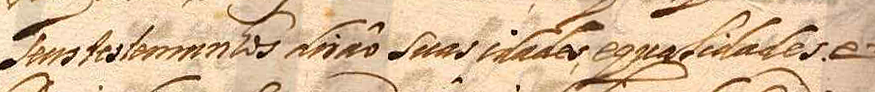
seus testemunhos diraõ suas idades, e qualidades, e
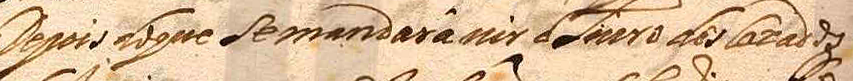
Depois do que se mandarā uir o Liuro dos Cazados
